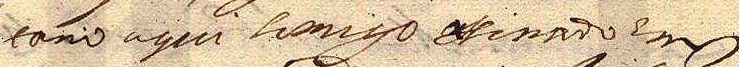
tario aqui comigo assinado Em
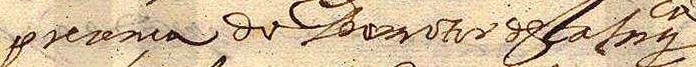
prezença do Promotor desta Inqcaõ
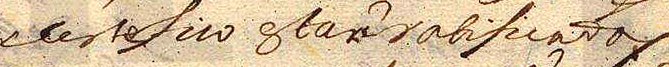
e certefico estarē ratificadas
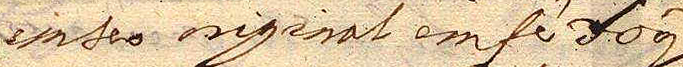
Em seo original em fé do q̄
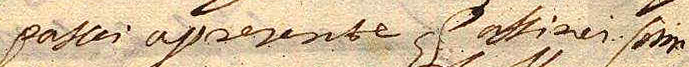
passei a prezente E assinei Coim
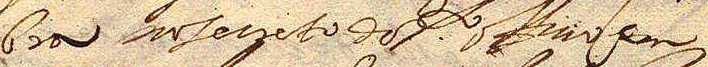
bra no secreto do s.to officio em
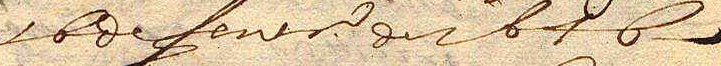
16 de feuero. de 1646
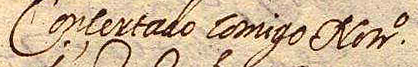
Conçertado comigo Notro.
